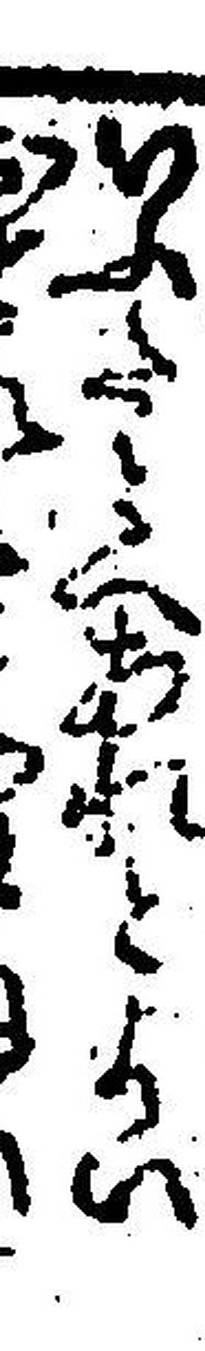いふたとへあれとよい
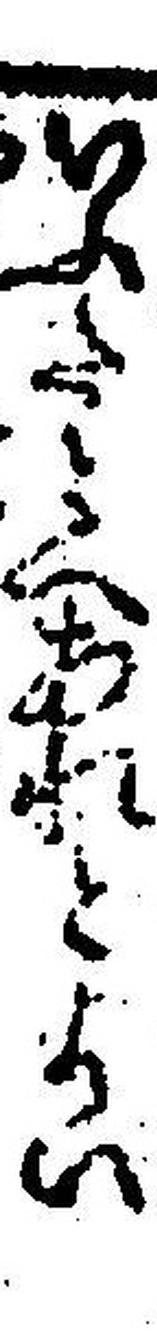いふたとへあれとよい
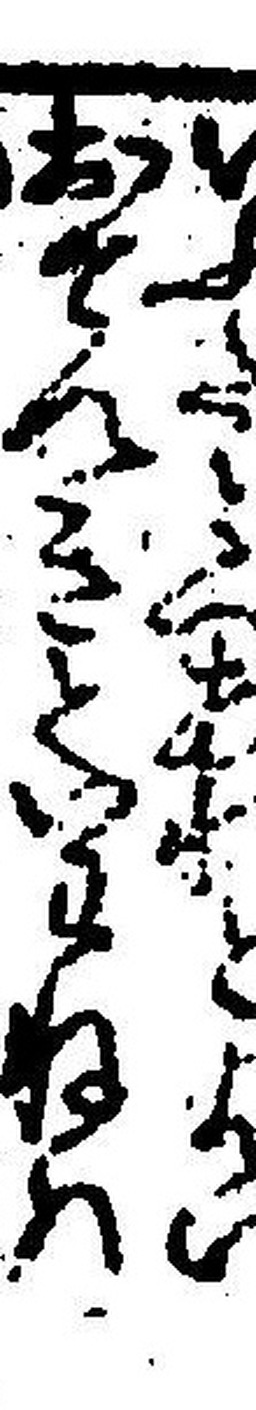おてんきといわねは
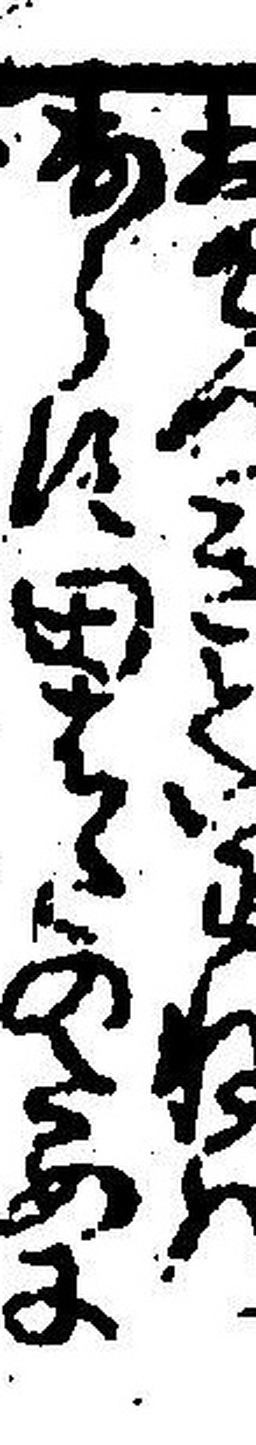ならす田はたのために
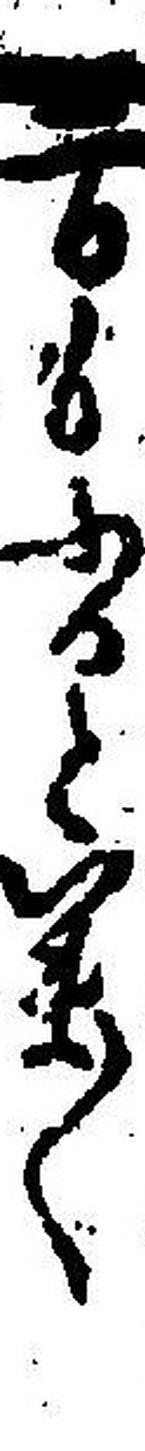二日もふるといま〳〵
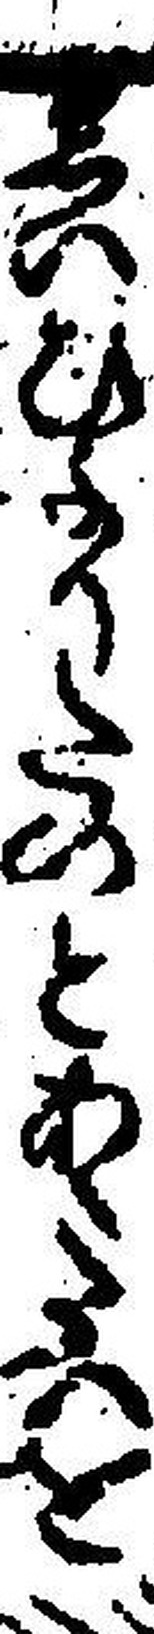しいひよりたのとあくたいを
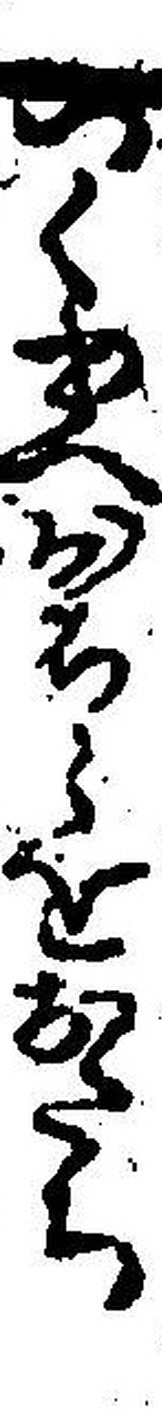つくゆへおはらをおたち
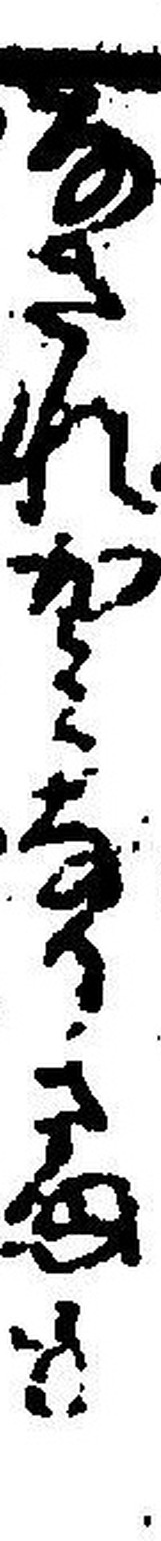なされかみなりさまも
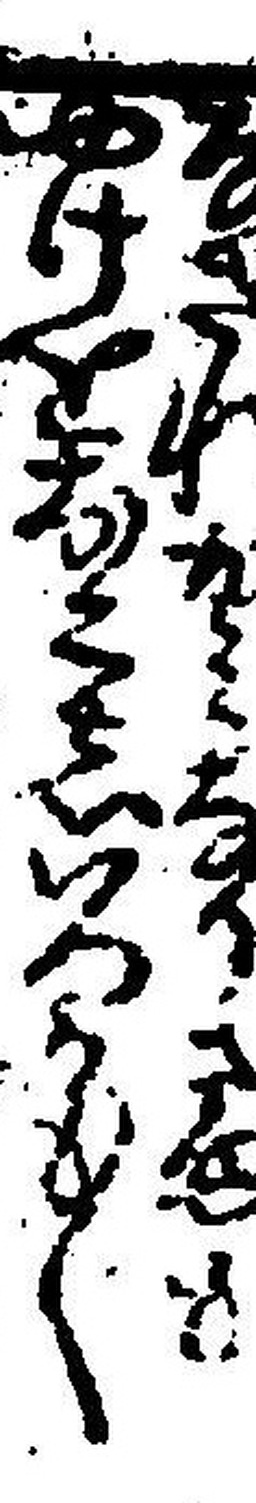やけをおこしいつかも〳〵
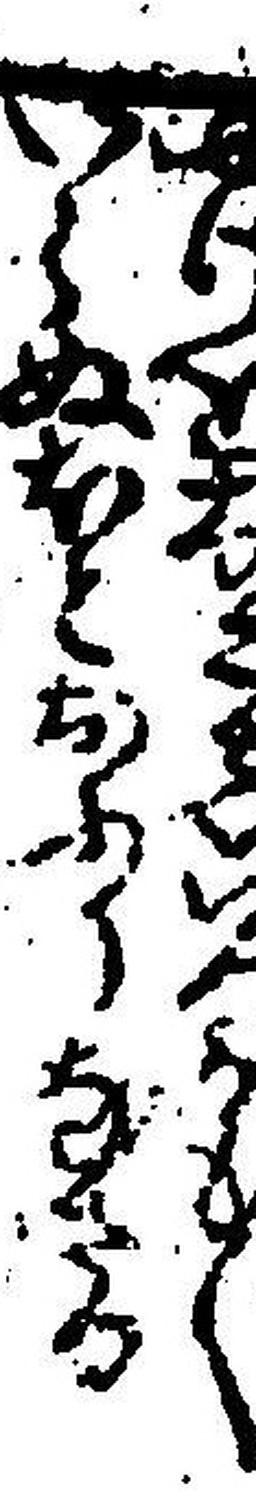いらぬほとおふりなさる
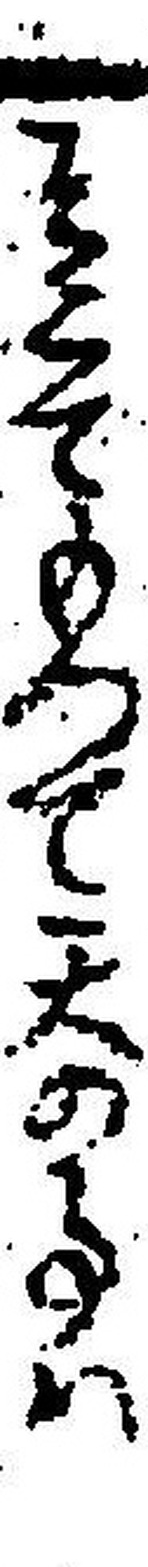そこてもつて天の事は
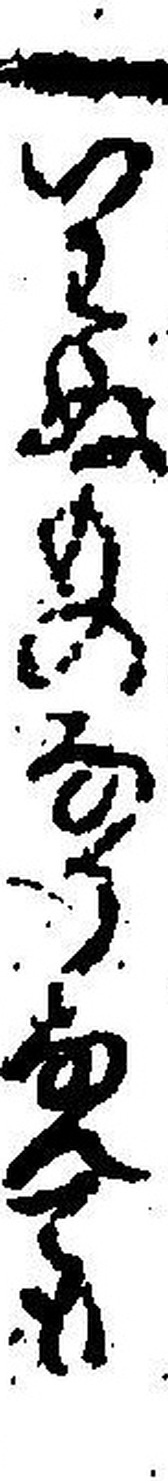いわぬものなりなんても
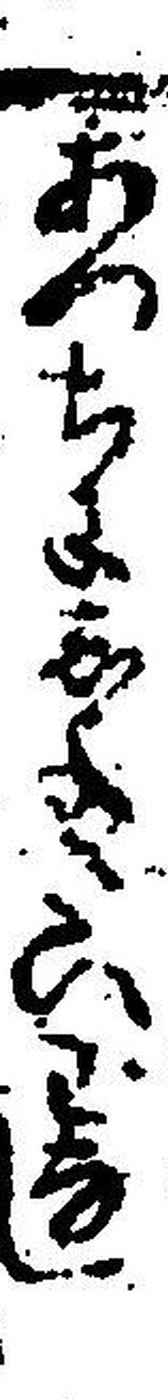あつちにしよさいはなし
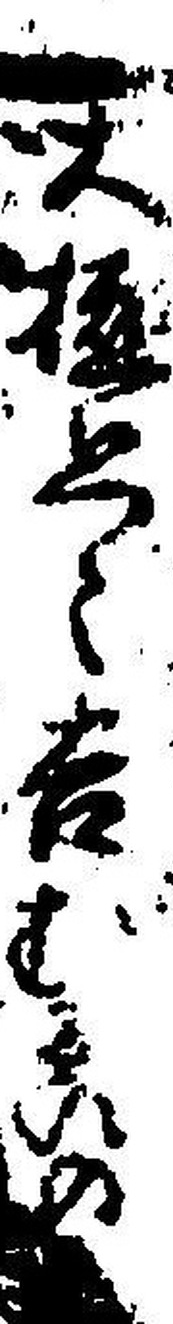大極上々吉むるいの
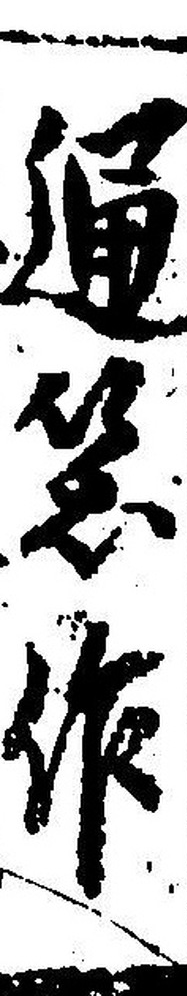通笑作
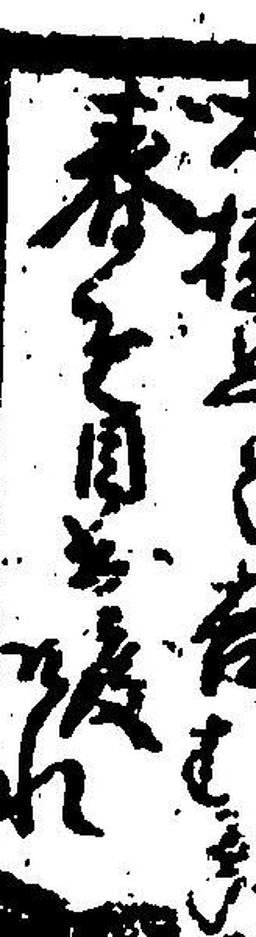春そ目出度
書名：天竺儲之筋 / 市場通笑作
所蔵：東京大学総合図書館 General Library in the University of Tokyo, JAPAN
